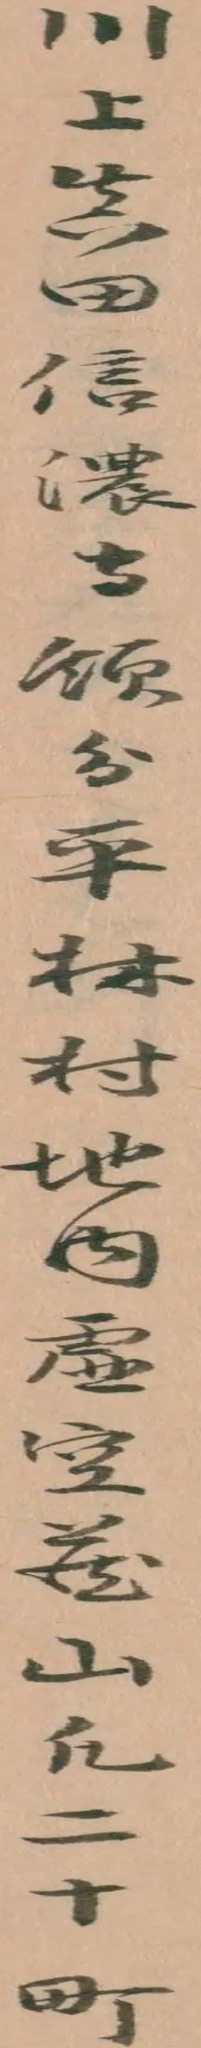川上真田信濃守領分平林村地内虚空蔵山凡二十町
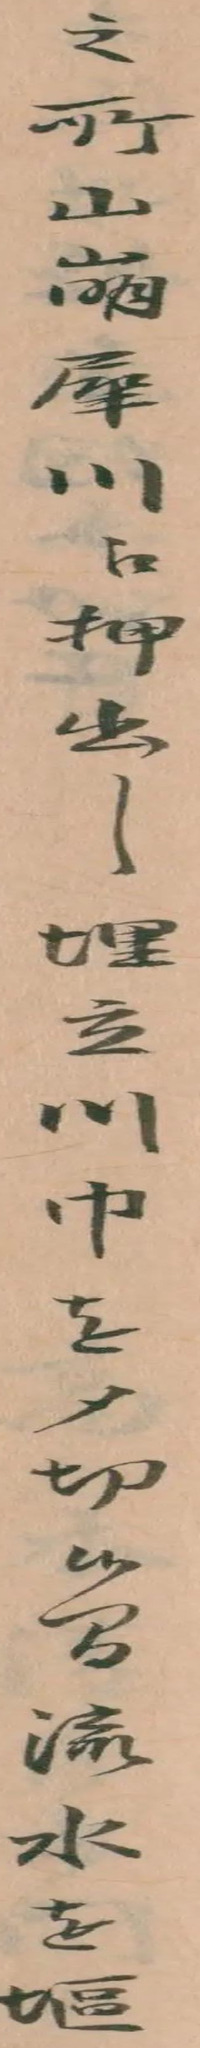之所山崩犀川江押出し埋立川中ヲ〆切候間流水を堰
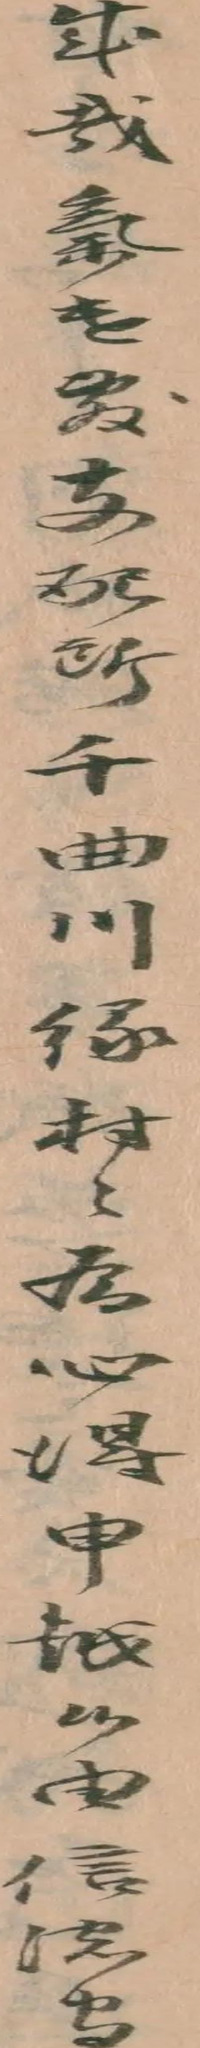成哉気遣敷支配所千曲川縁村々為心得申越候由信濃守
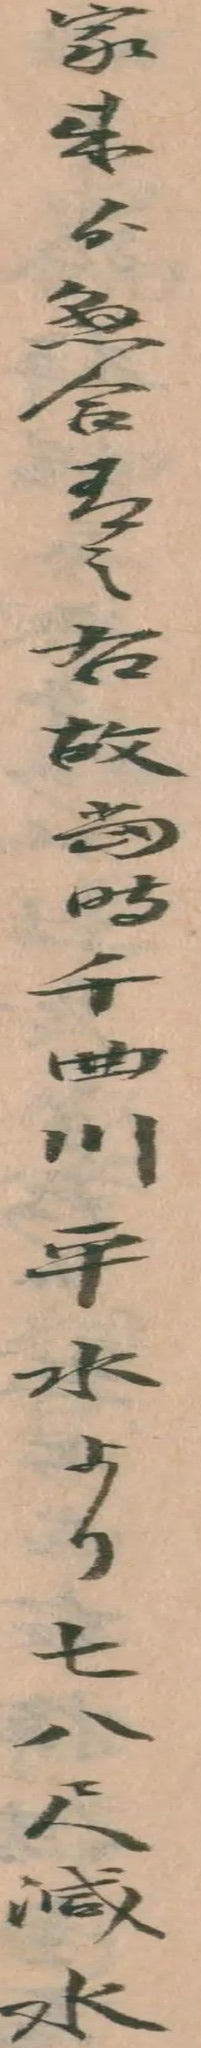家来ゟ懸合有之右故当時千曲川平水より七八尺減水
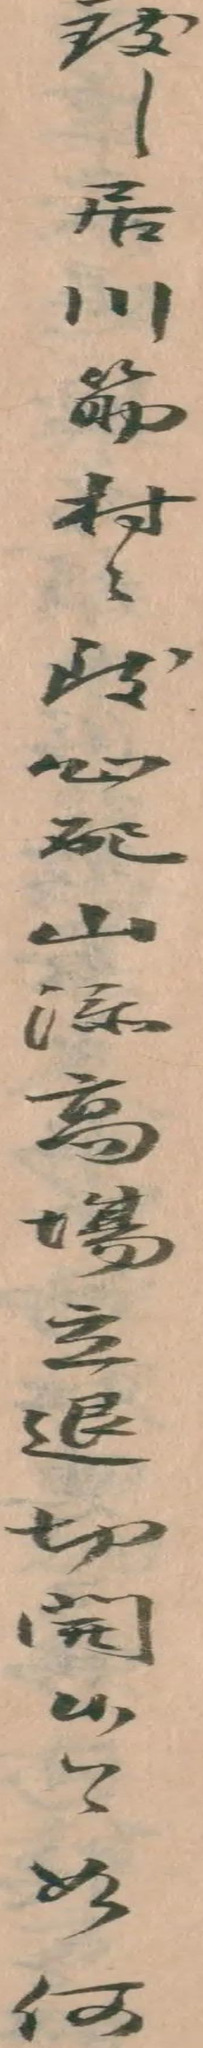致し居川筋村々致心配山添高場立退切開候ハヽ如何
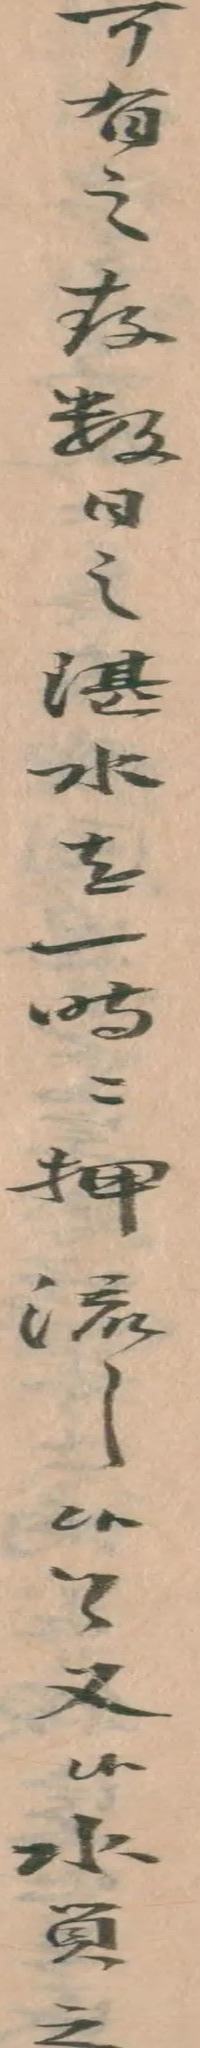可有之存数日之湛水を一時二押流し候ハゝ又候水災之
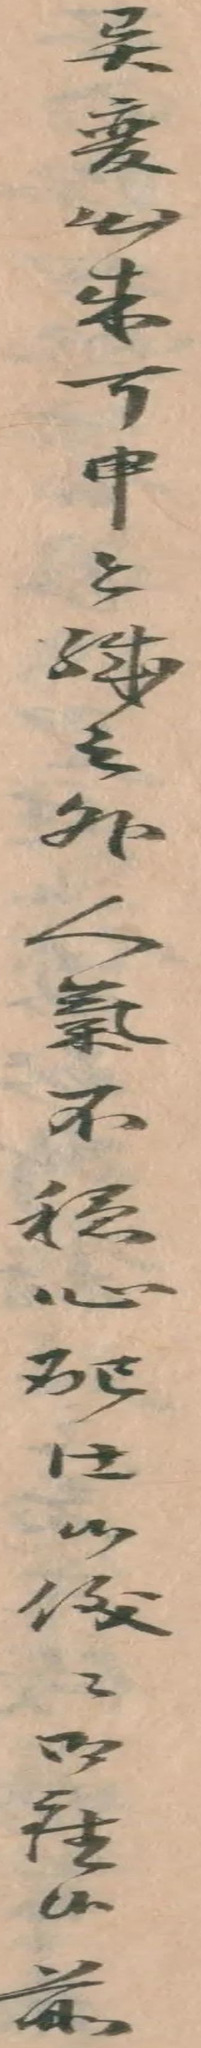異変出来可申と殊之外人気不穏心配仕候儀ニ御座候前
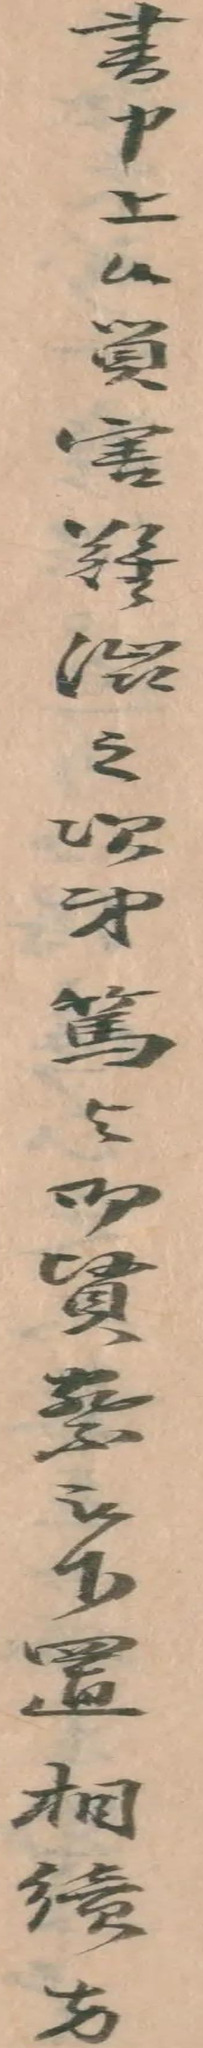書申上候災害難渋之次第篤と御賢察被下置相続方
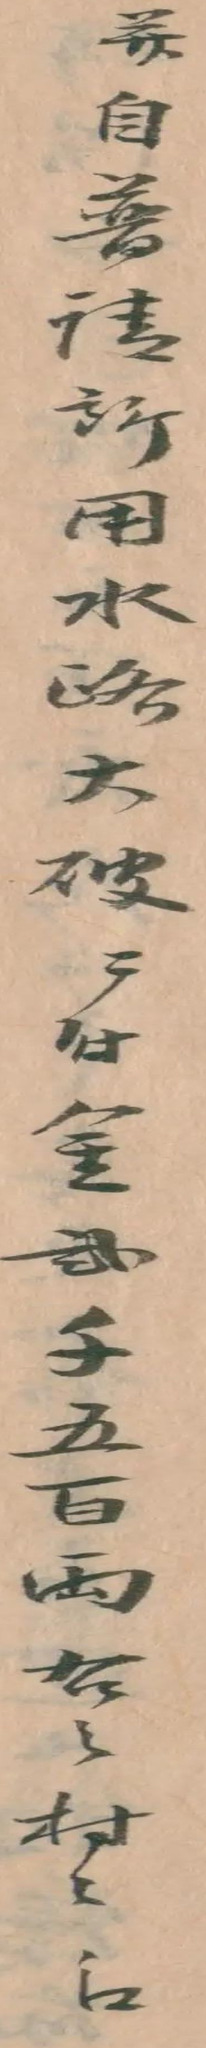并自普請所用水路大破ニ付金弐千五百両右之村々江

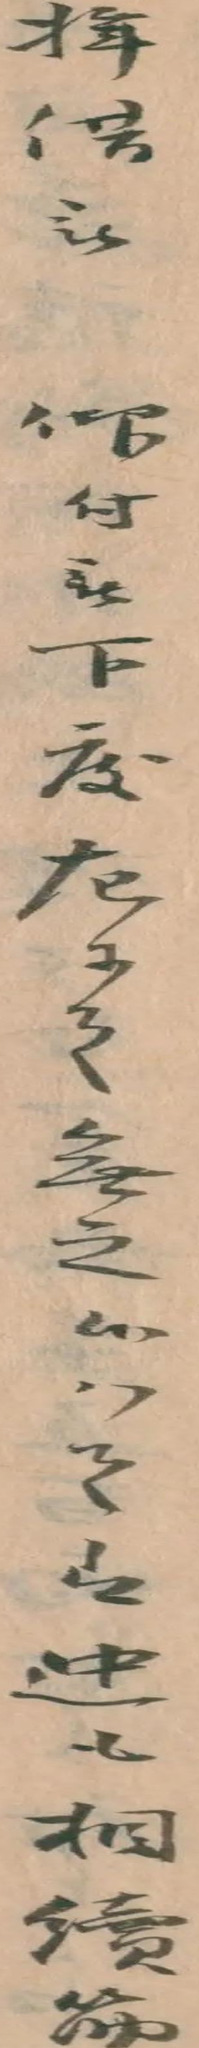拝借被仰付被下度左にて無之候ては迚も相続筋
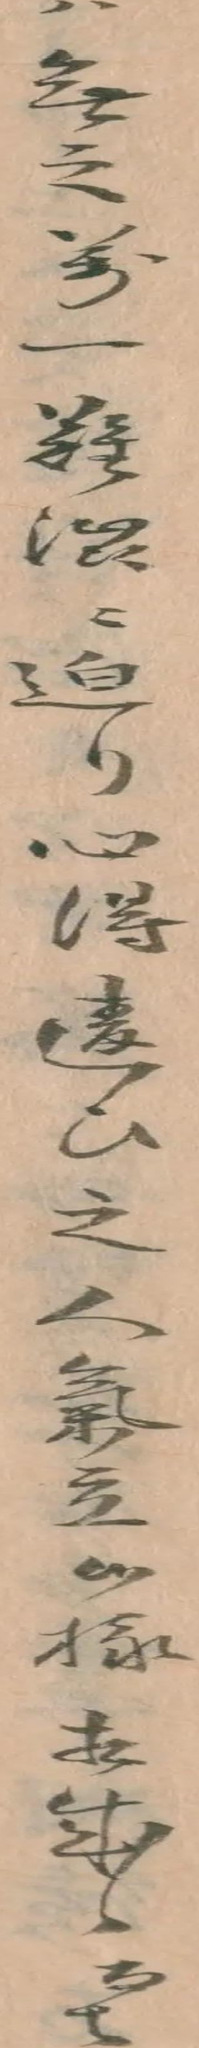ハ無之万一此上難渋二迫り心得違之人気立候様相成候而者
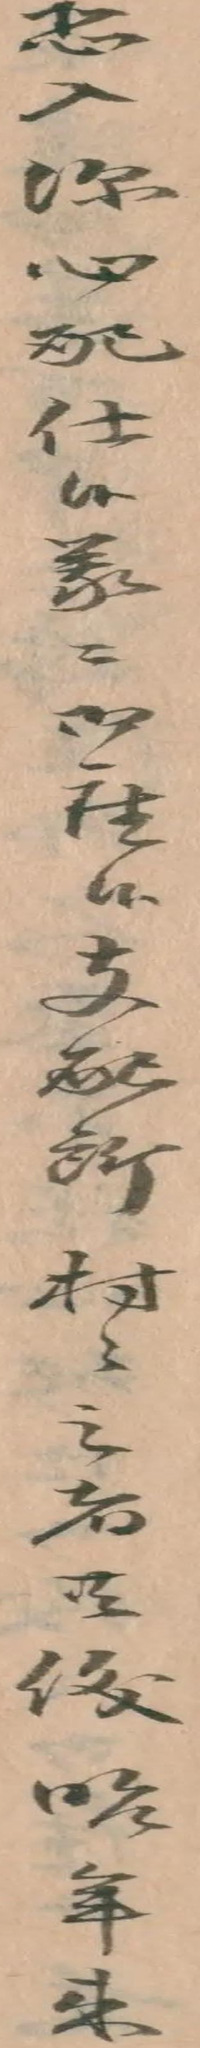恐入深心配仕候義ニ御座候支配所村々之者共儀昨年来
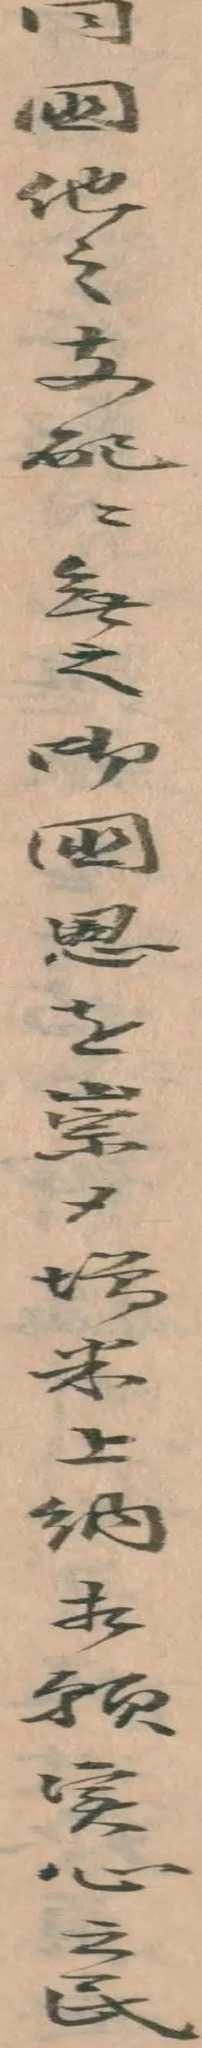同国他之支配ニ無之御国恩を崇め増米上納相願実心之民
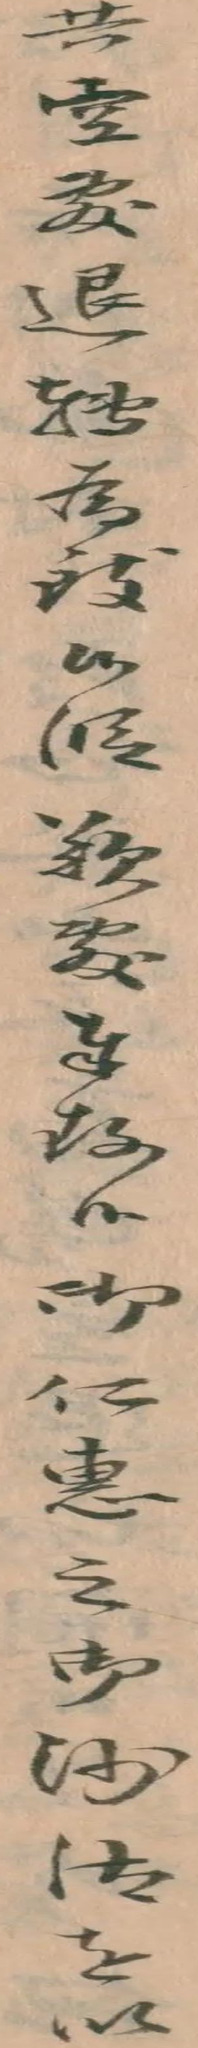共穴敷退転為致候段歎敷奉存候御仁恵之御沙汰ヲ以
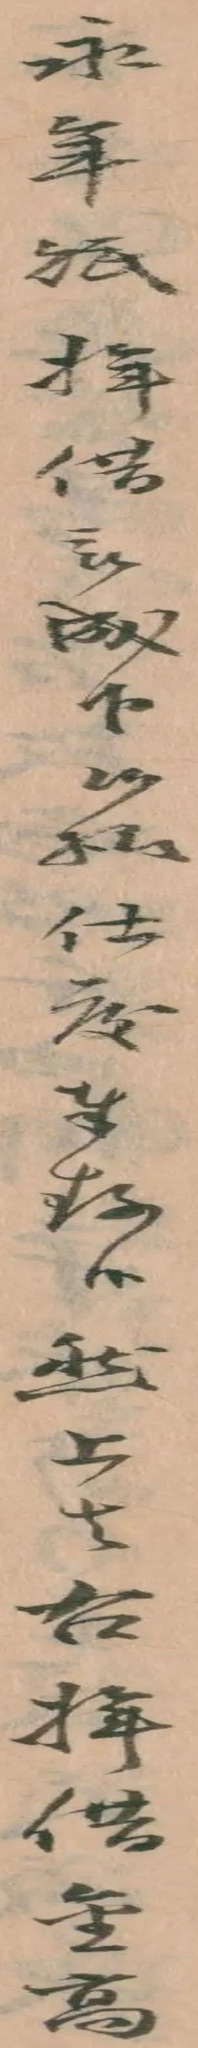永賦拝借被成下候様仕度奉存候然上者右拝借金高
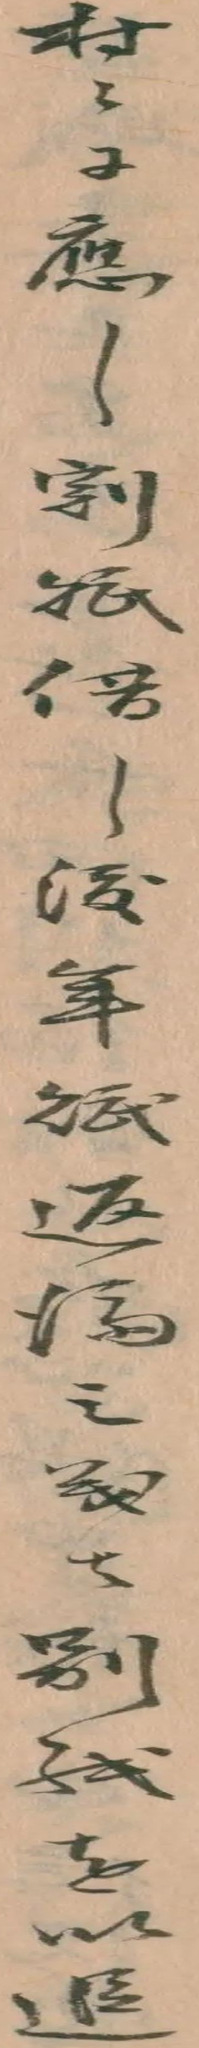村々に応し割賦借し渡年賦返納之儀者別紙を以追
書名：地災撮要. 巻3(地震之部)-巻4(噴火之部)
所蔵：国立国会図書館 National Diet Library, JAPAN
